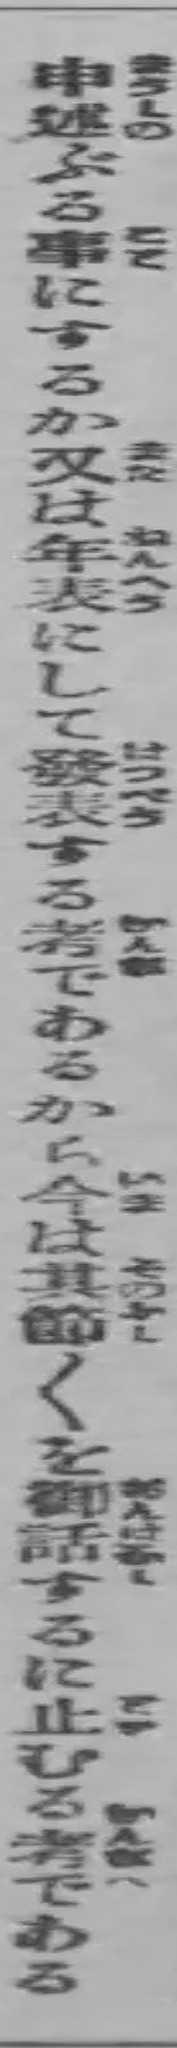申述ぶる事にするか又は年表にして発表する考であるから今は其節〳〵を御話するに止むる考である
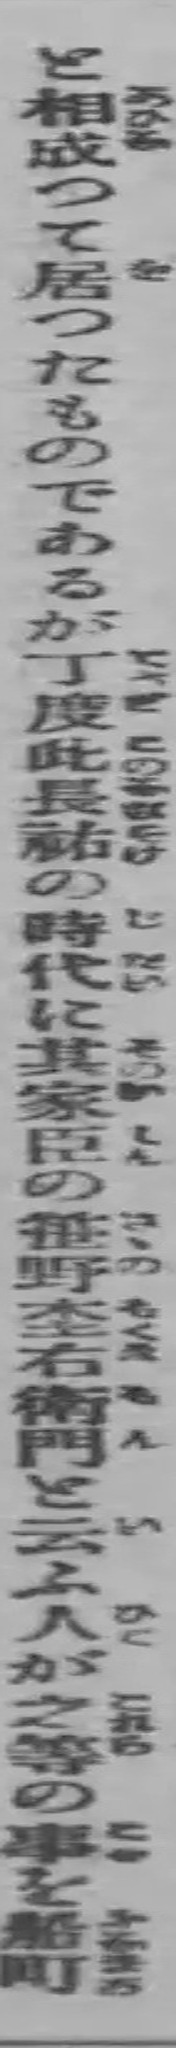と相成つて居つたものであるが丁度此長祐の時代に其家臣の笹野杢右衛門と云ふ人が之等の事を船町
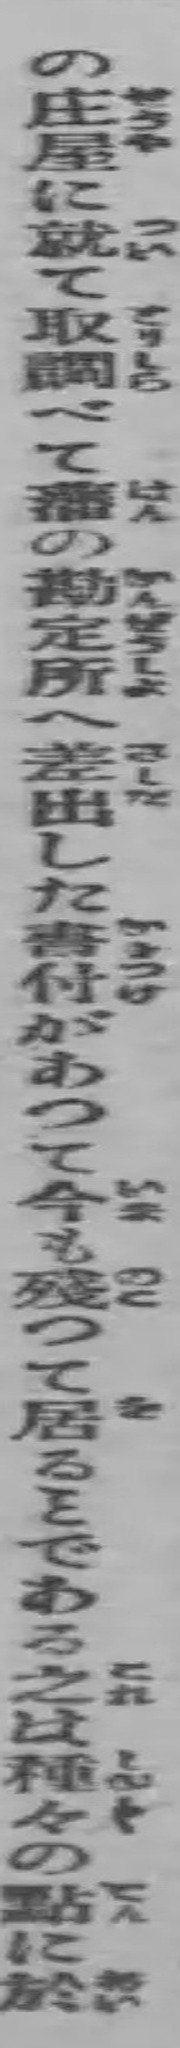の庄屋に就て取調べて藩の勘定所へ差出した書付があつて今も残つて居ることである之は種々の点に於
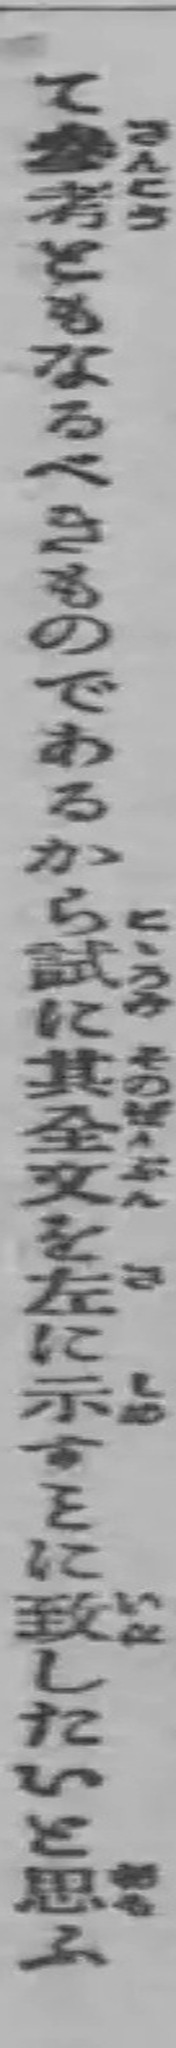て参考ともなるべきものであるから試に其全文を左に示すことに致したいと思ふ
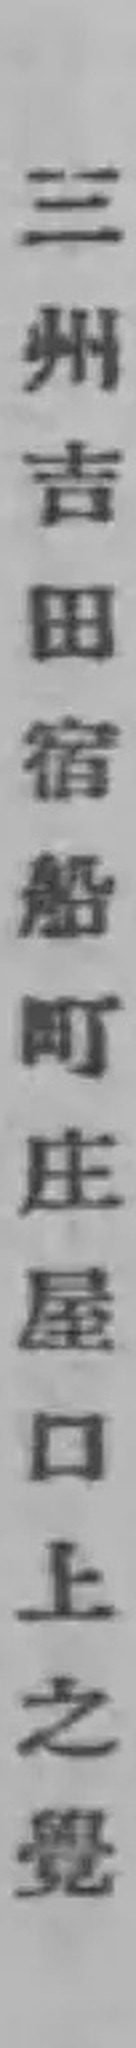三州吉田宿船町庄屋口上之覚
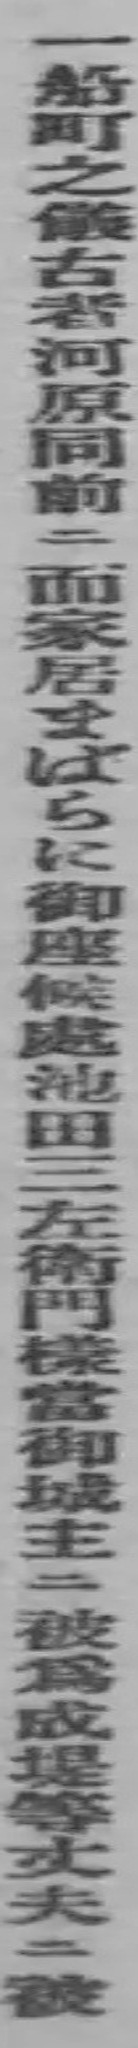一船町之儀右者河原同前ニ而家居まばらに御座候処池田三左衛門様当御城主ニ被為成堤等丈夫ニ被
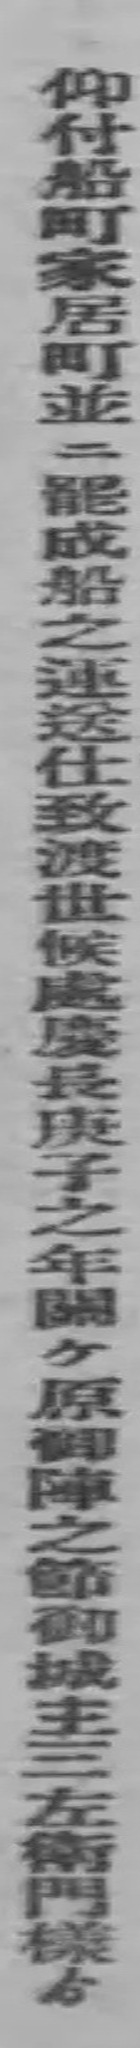仰付船町家居町並ニ罷成船之運送仕致渡世候処慶長庚子之年関ケ原御陣之節御城主三左衛門様ゟ
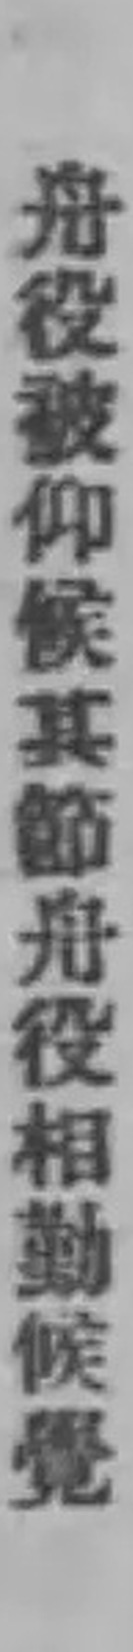舟役被仰候其節舟役相勤候覚
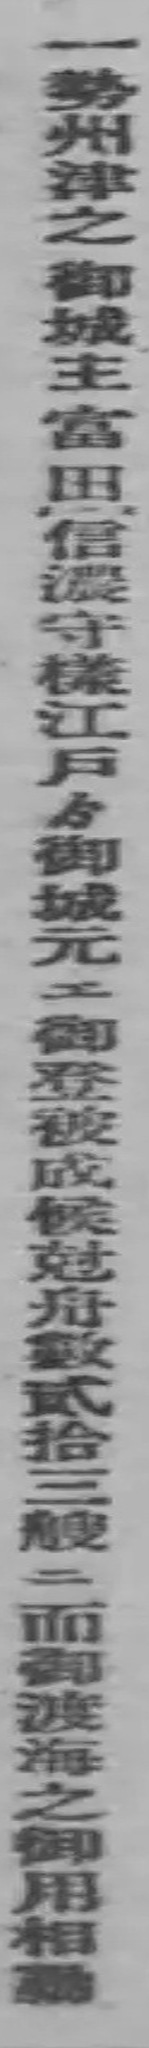一勢州津之御城主富田信濃守様江戸ゟ御城元エ御登被成候尅舟数弐拾三艘ニ而御渡海之御用相勤
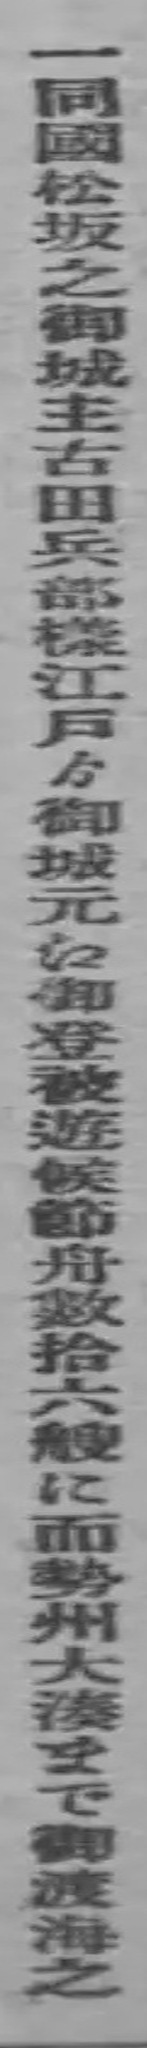一同国松坂之御城主古田兵部様江戸ゟ御城元え御登被遊候節舟数拾六艘に而勢州大湊まで御渡海之
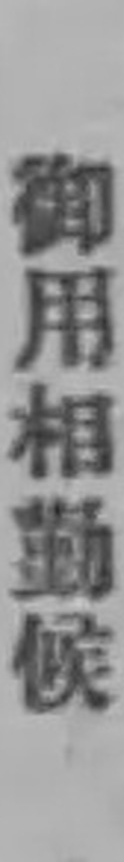御用相勤候
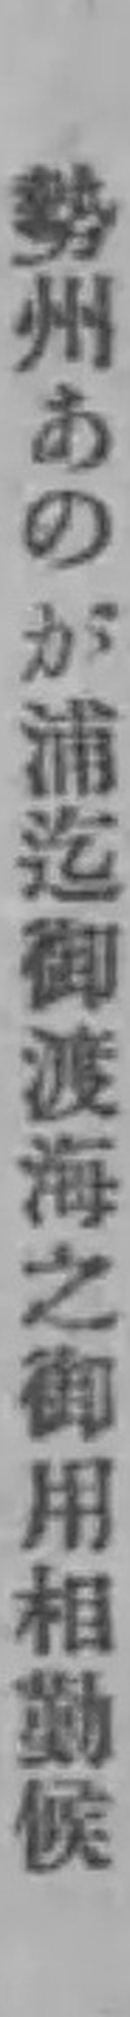勢州あのが浦迄御渡海之御用相勤候
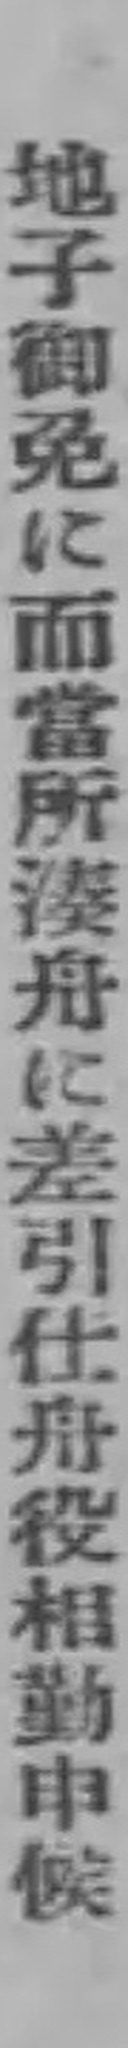地子御免に而当所湊舟に差引仕舟役相勤申候
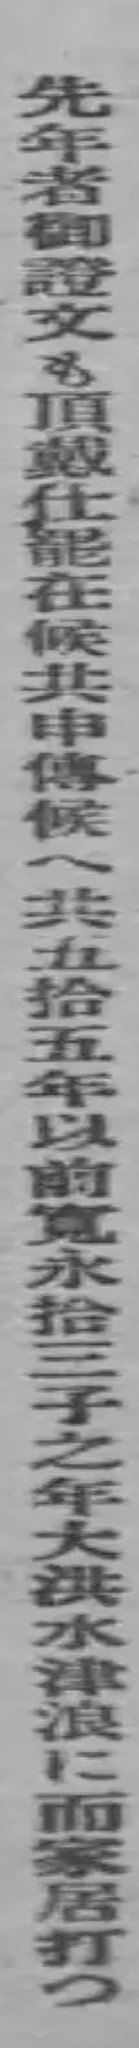先年者御証文も頂戴仕罷在候共申伝候へ共五拾五年以前寛永拾三子之年大洪水津浪に而家居打つ
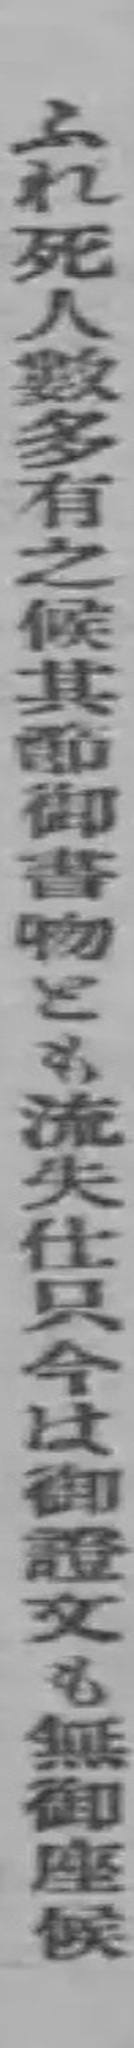ふれ死人数多有之候其節書物とも流失仕只今は御証文も無御座候
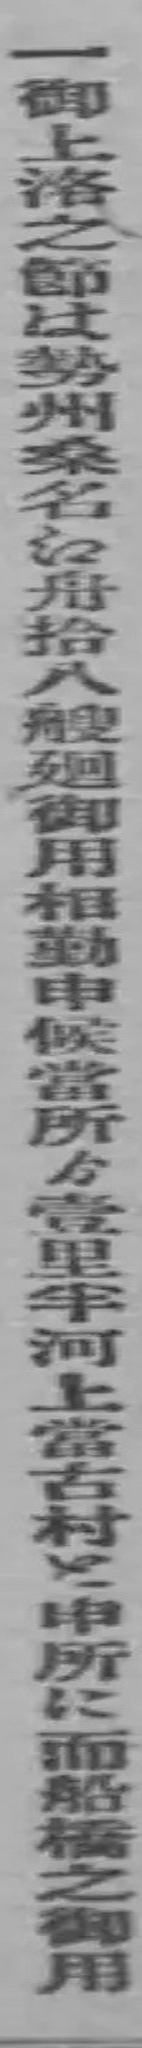一御上洛之節は勢州桑名え舟拾八艘廻御用相勤申候当所ゟ壱里半河上当古村と申所に而船橋之御用
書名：豊橋市史談
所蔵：国立国会図書館 National Diet Library, JAPAN
